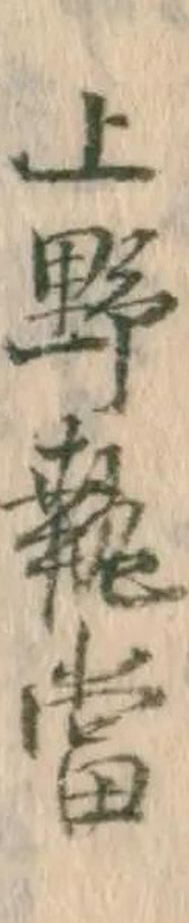上野執当
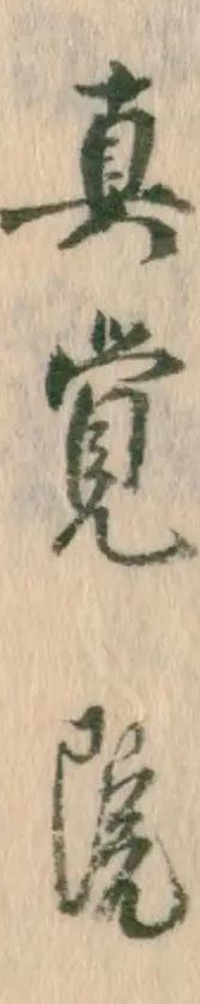真覚院
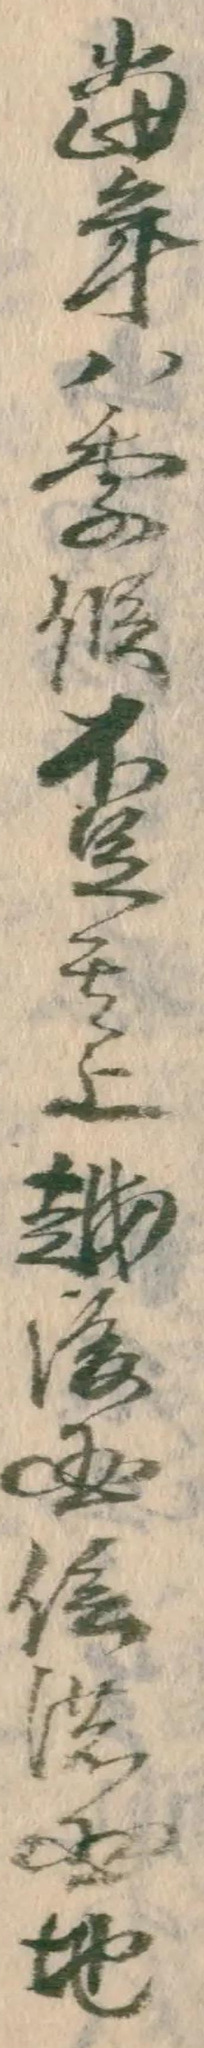当年ハ季候不足其上越後国信濃国地
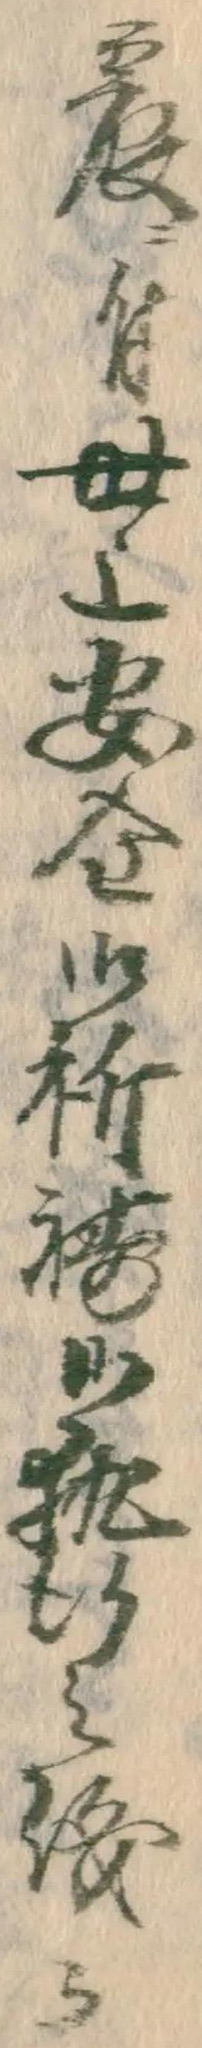震二付此上安全御祈祷御執行之儀被
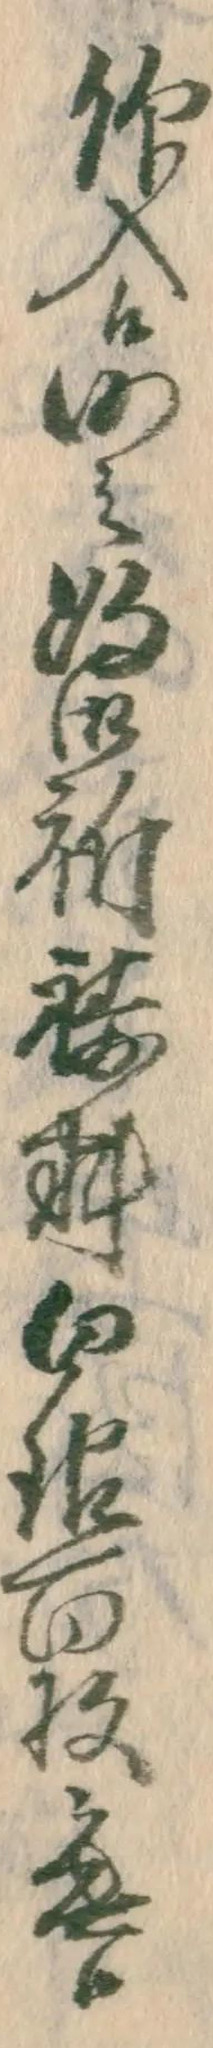仰入候仍之為御祈祷料白銀百枚被遣候
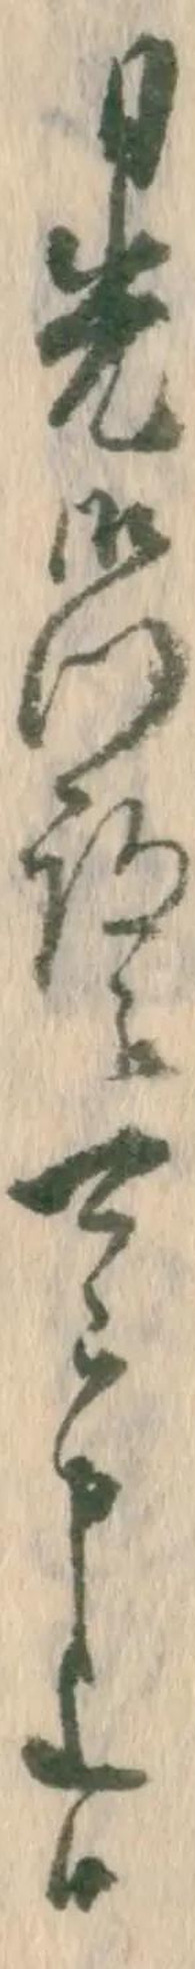日光御門跡江可被申上候
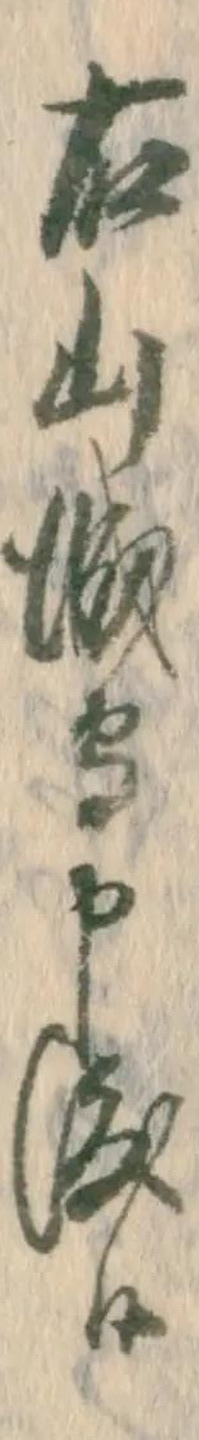右山城守申渡候
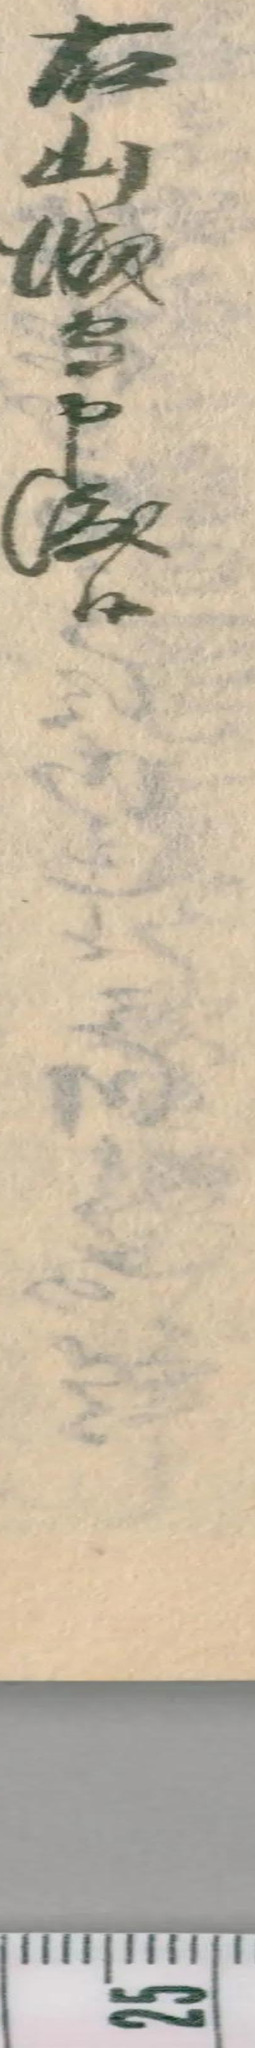右山城守申渡候
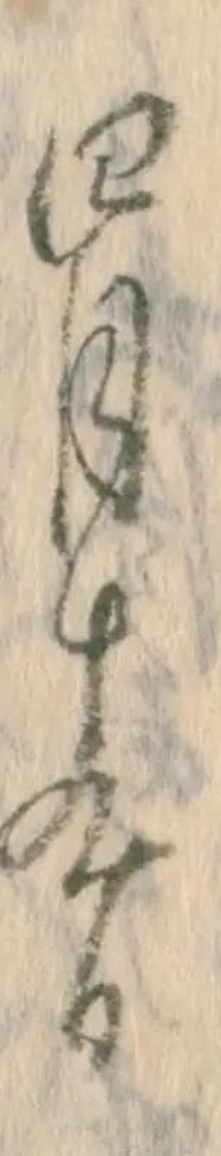四月十九日

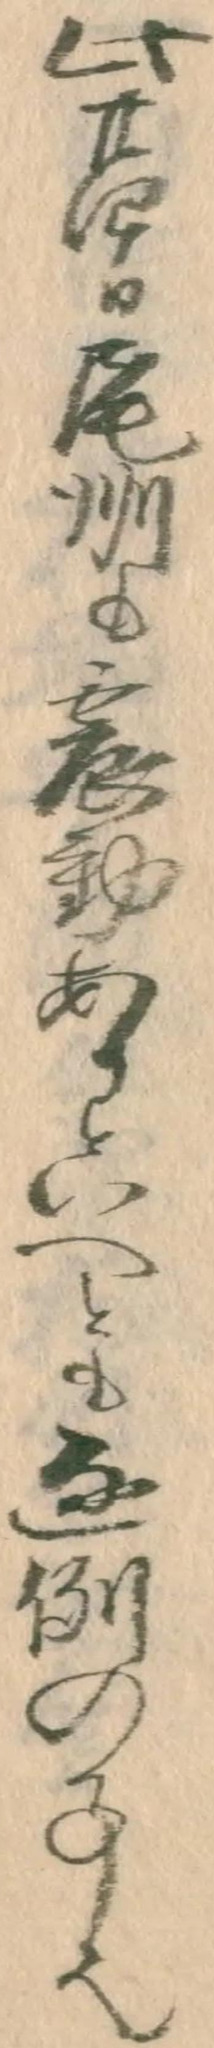此廿四日尾州も震動ありといへとも通例の事也
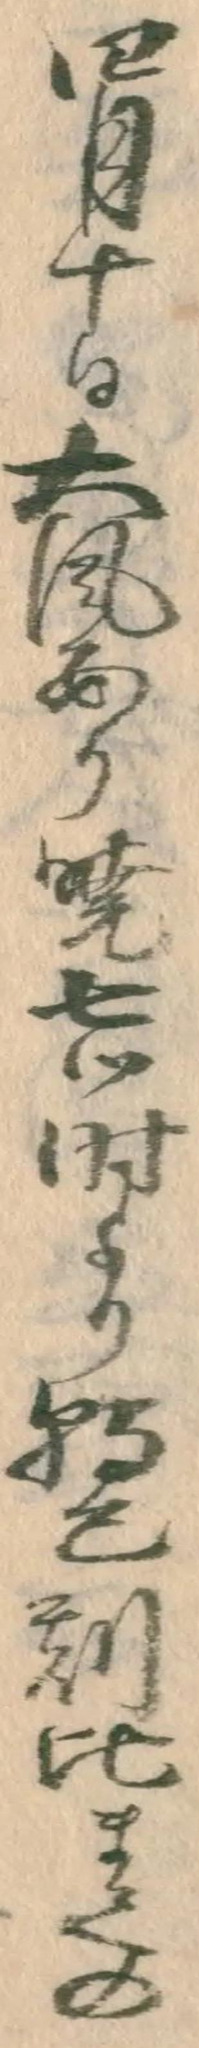四月十日大風あり暁七ッ時より朝巳刻刻比まての
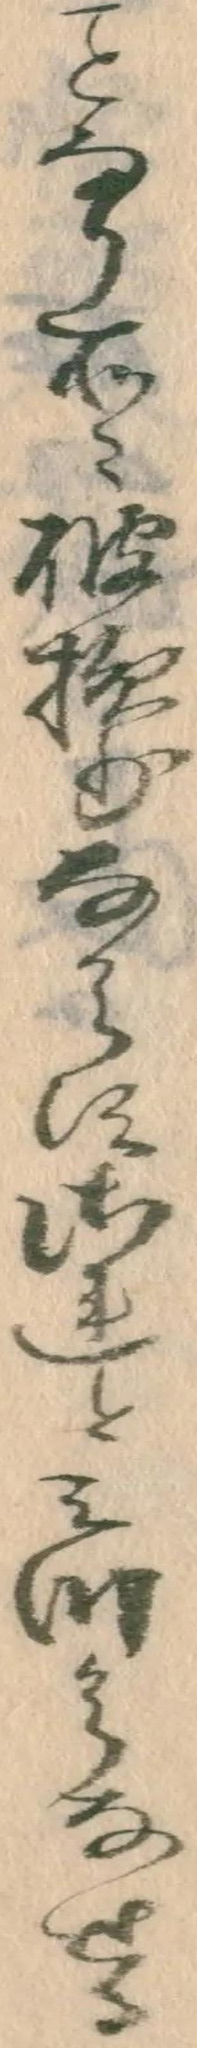ことなり所々破損少ならす御れとミつからなせる
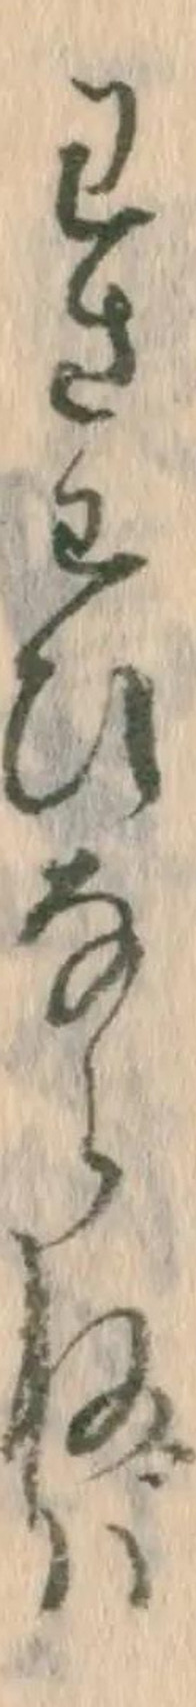わさわひならねハ
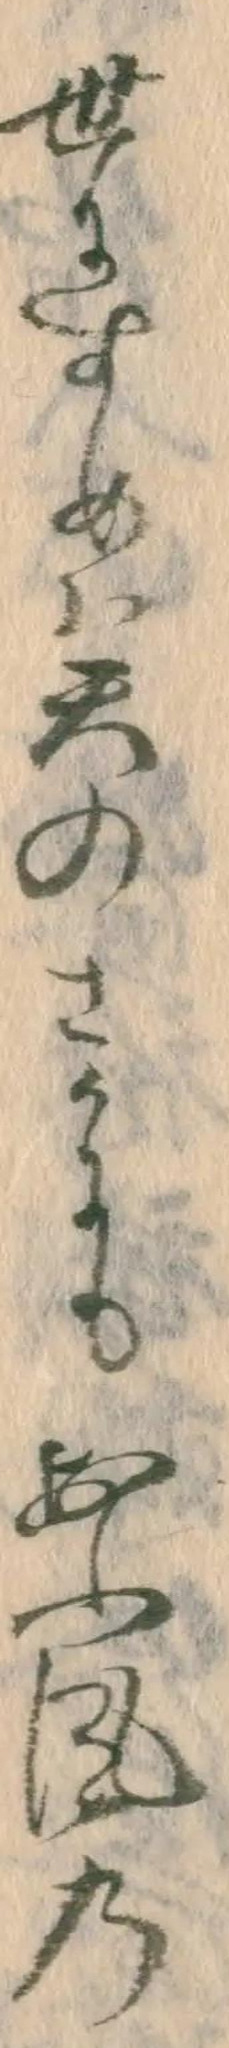世にすめハ天のさかにもあふ風の
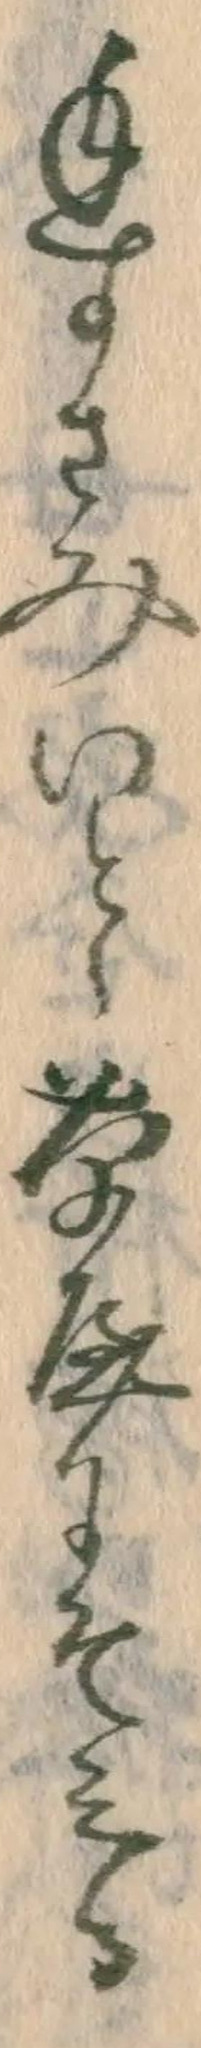手すさみいとゝ草屋にそみる
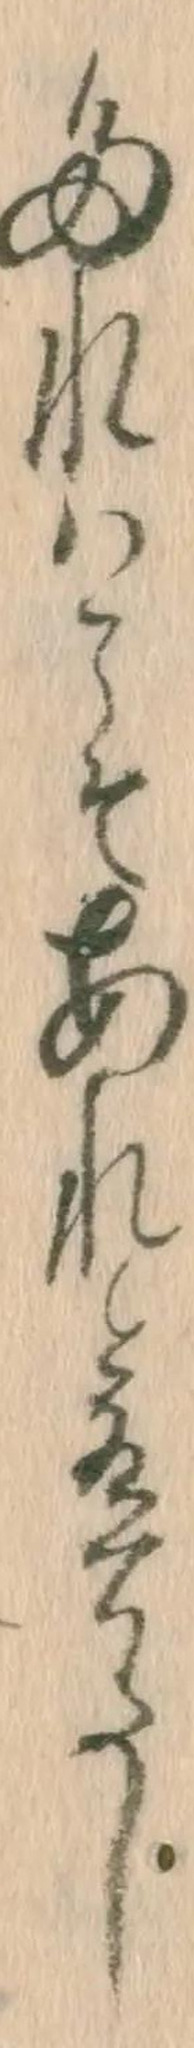たれはにそあれと有かたし
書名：信州大地震之記
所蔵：国立国会図書館 National Diet Library, JAPAN
